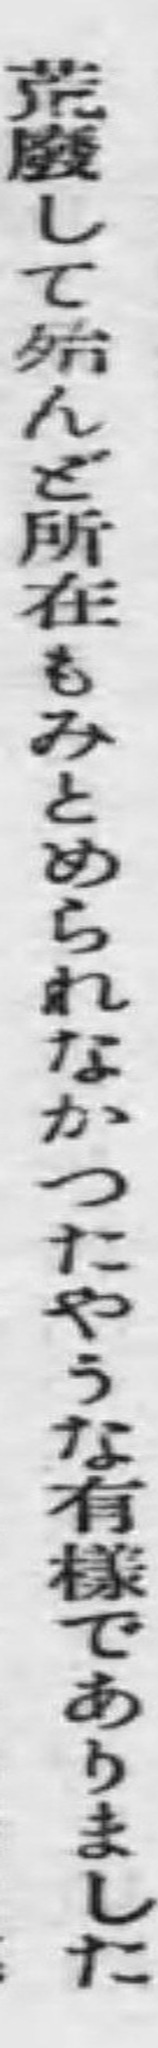荒廃して殆んど所在もみとめられなかつたやうな有様でありました
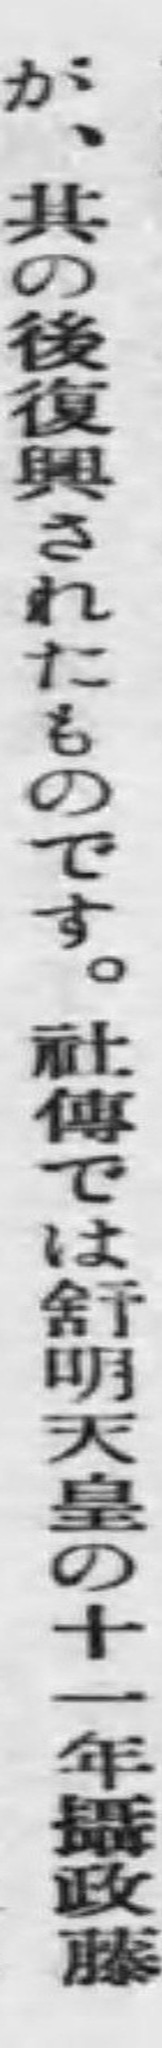が、其の後復興されたものです。社伝では舒明天皇の十一年摂政藤
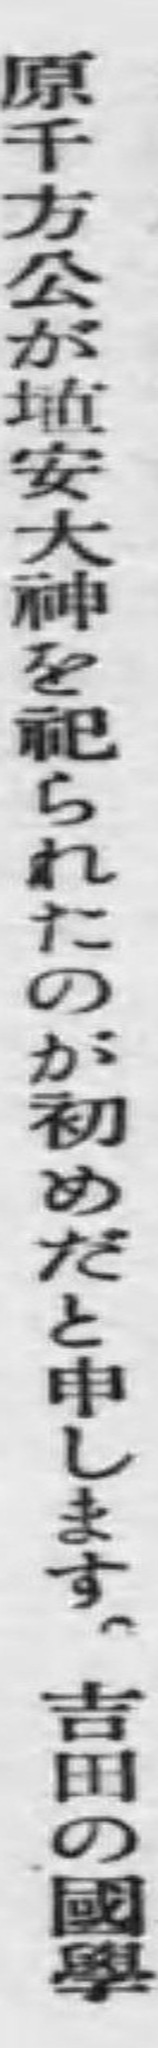原千方公が埴安大神を祀られたのが初めだと申します。吉田の国学
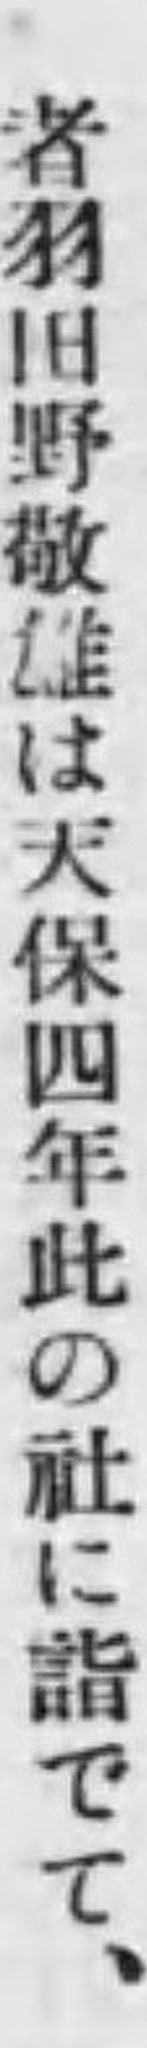者羽田野敬雄は天保四年此の社に詣でて、
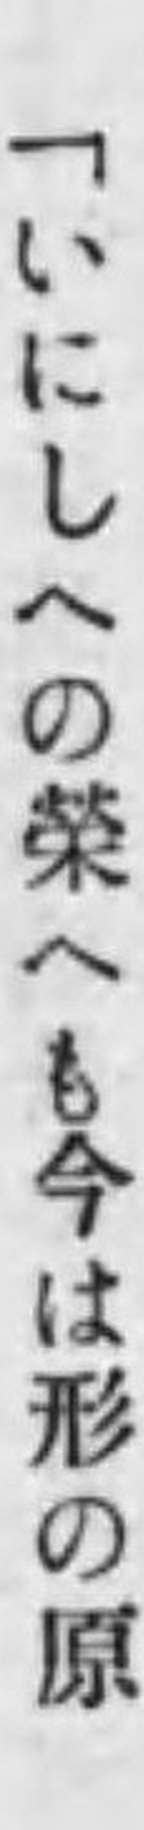「いにしへの栄へも今は形の原
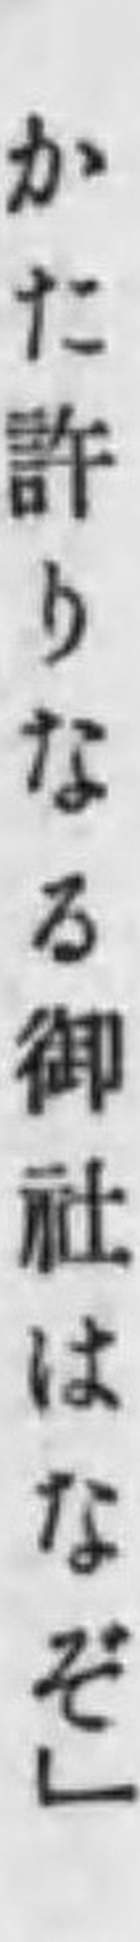かた許りなる御社はなぞ」
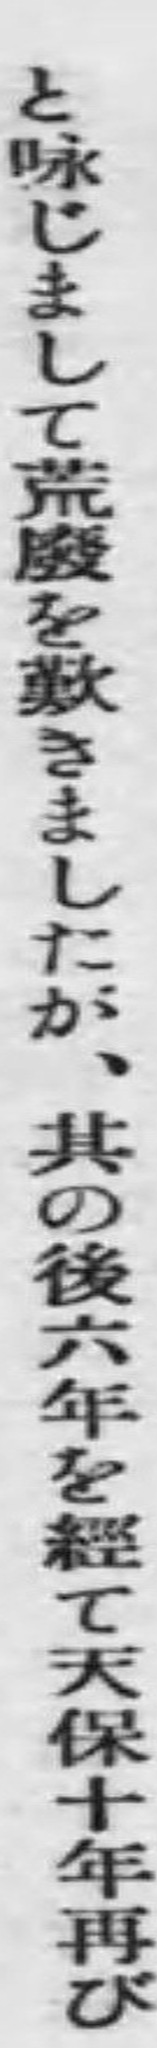と咏じまして荒廃を歎きましたが、其の後六年を経て天保十年再び
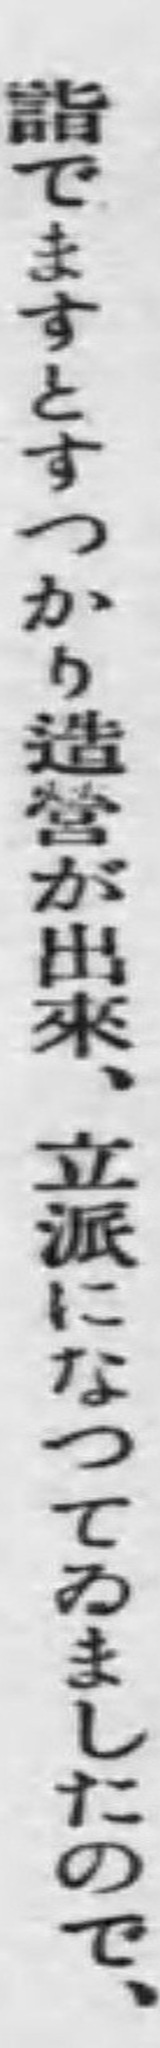詣でますとすつかり造営が出来、立派になつてゐましたので、
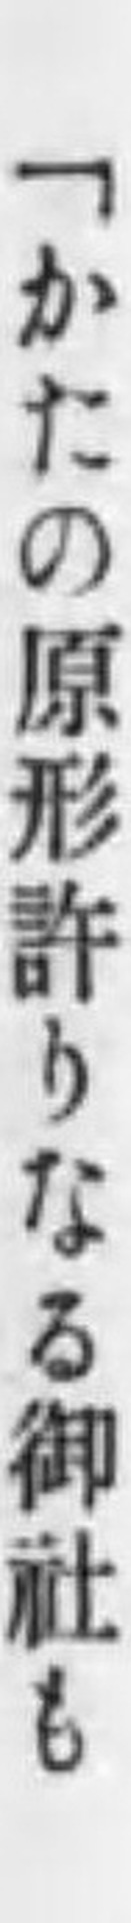「かたの原形許りなる御社も
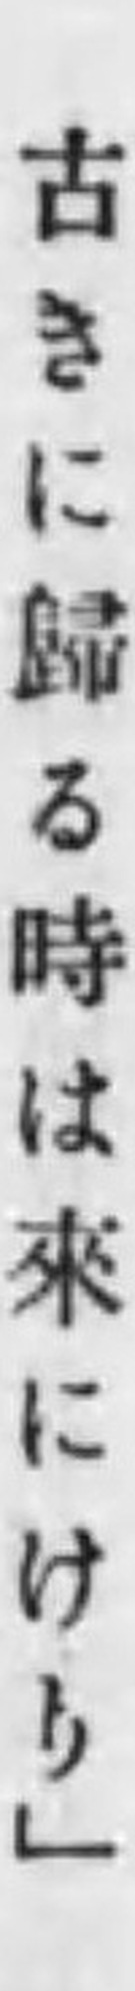古きに帰る時は来にけり」
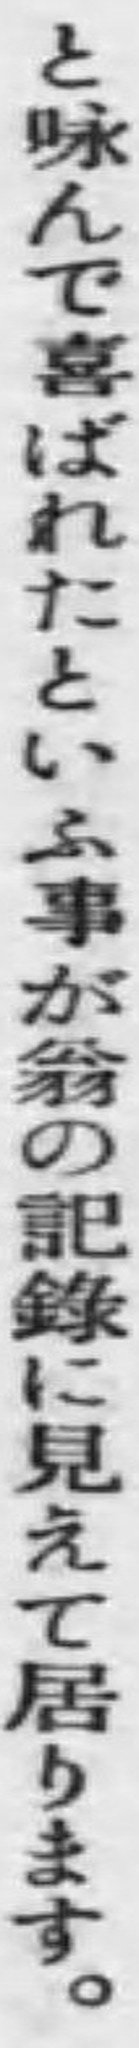と咏んで喜ばれたといふ事が翁の記録に見えて居ります。
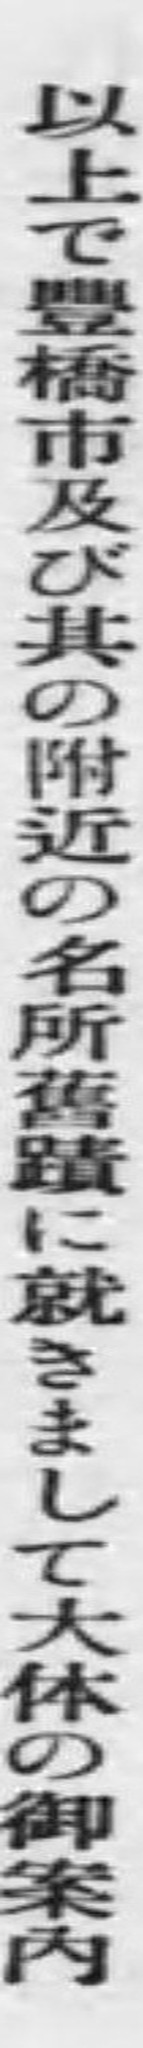以上で豊橋市及び其の附近の名所旧蹟に就きまして大体の御案内
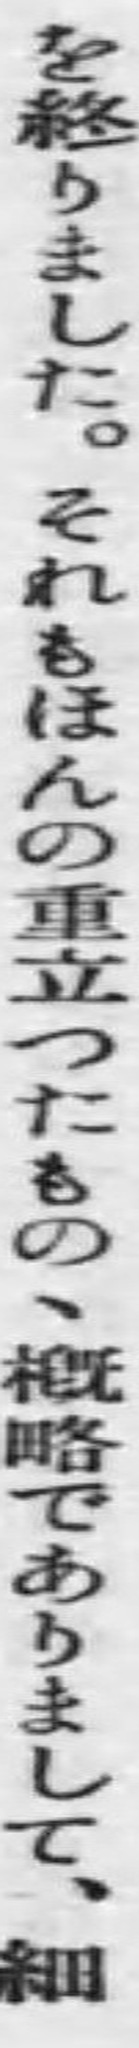を終りました。それもほんの重立つたものゝ概略でありまして、細
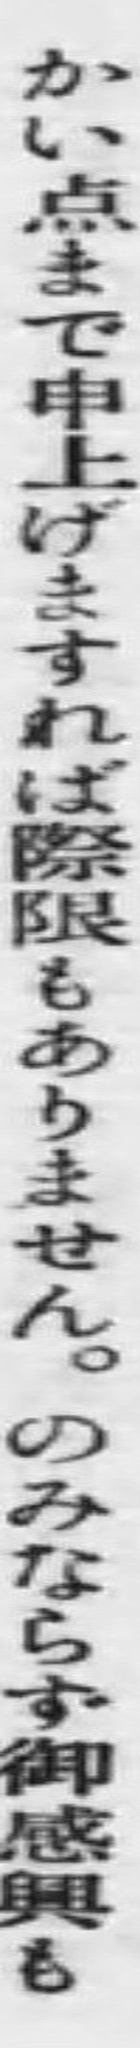かい点まで申上げますれば際限もありません。のみならず御感興も
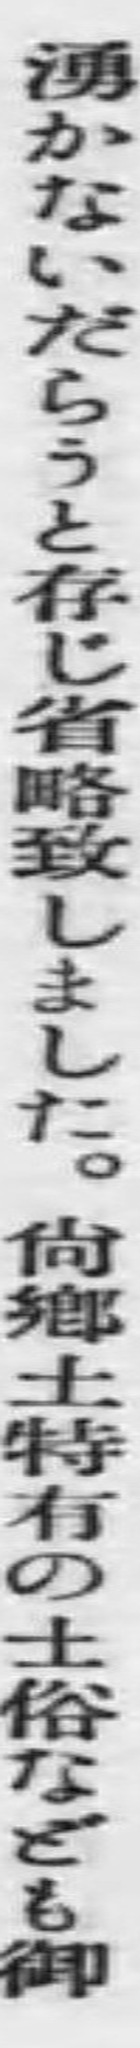湧かないだらうと存じ省略致しました。尚郷土特有の士俗なども御
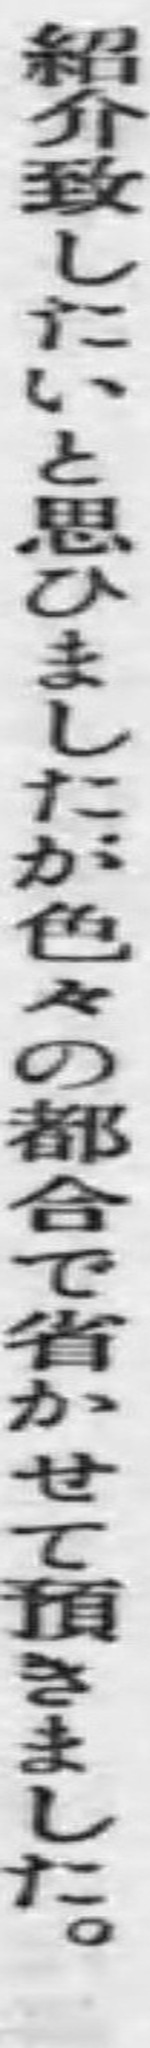紹介致したいと思ひましたが色々の都合で省かせて頂きました。
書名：東三河道中記 : 豊橋市及其附近案内
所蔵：国立国会図書館 National Diet Library, JAPAN
